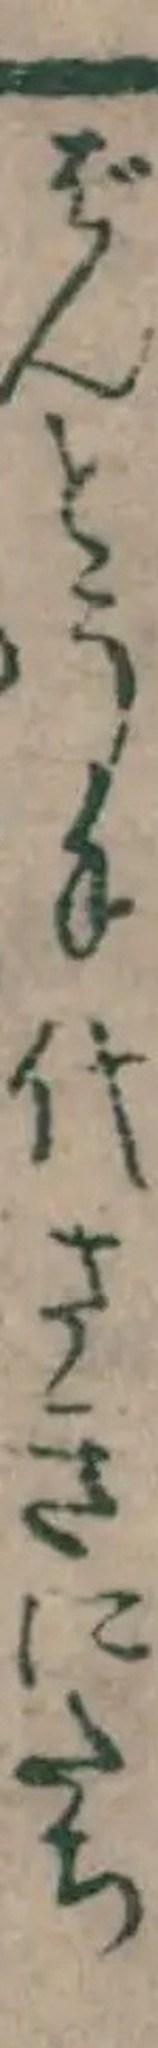ばんとう手代さきにたち
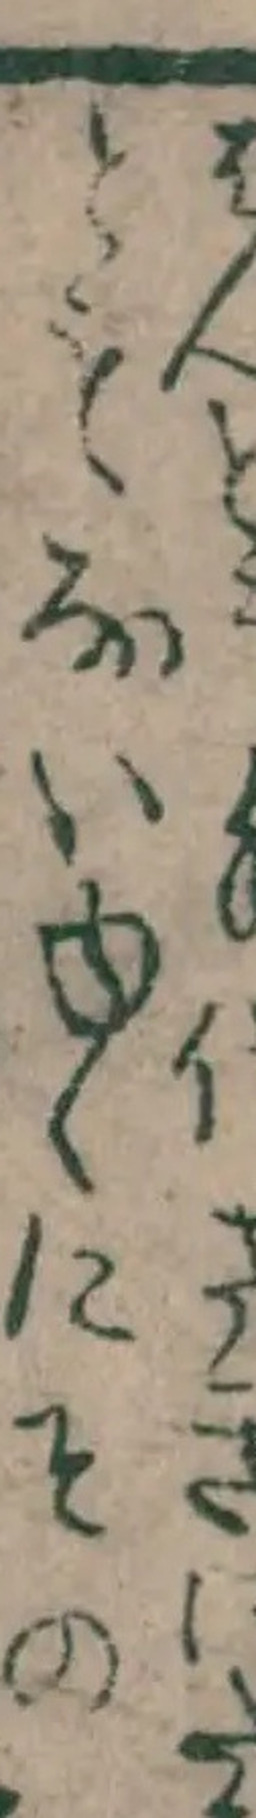ともないゆくにその
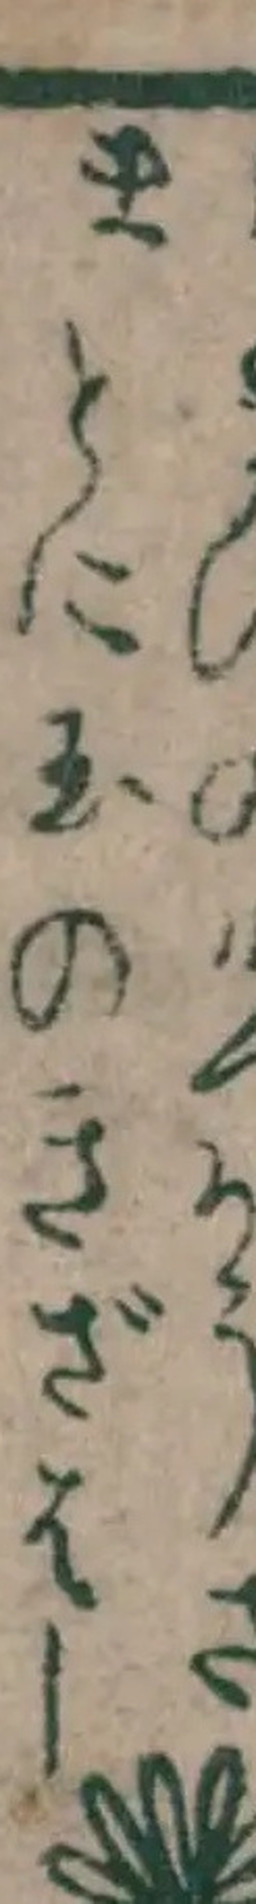まことに玉のきざはし
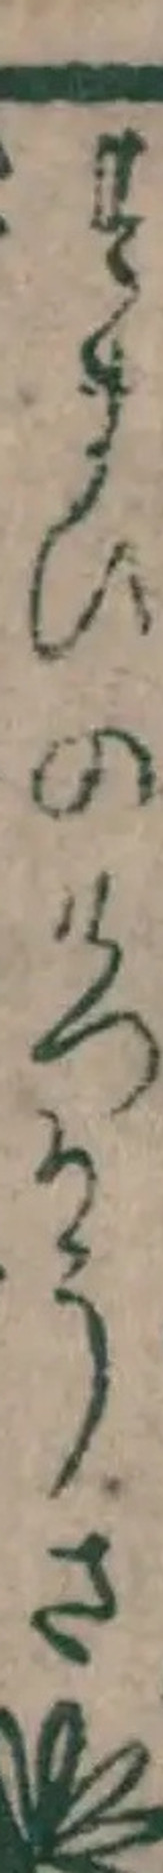すまひのけつかうさ
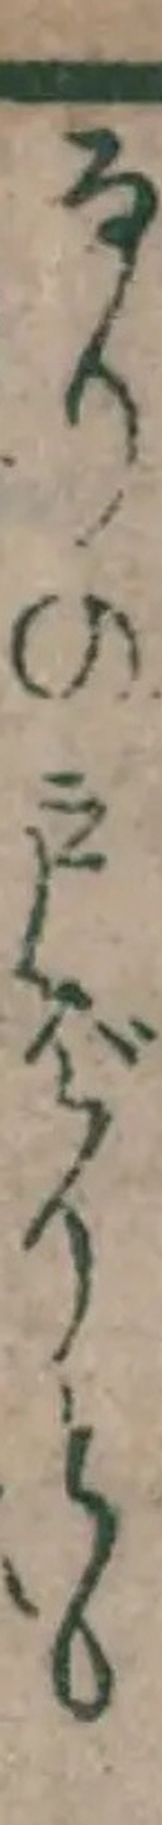るりの戸ばりとも
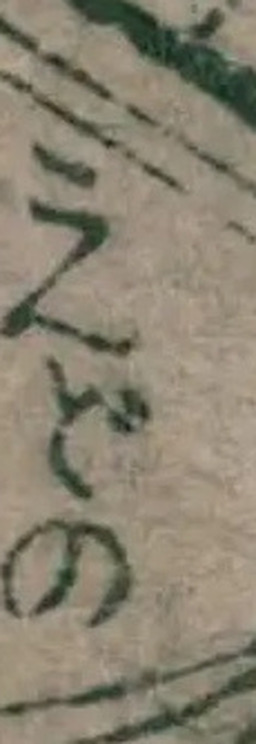こんどの
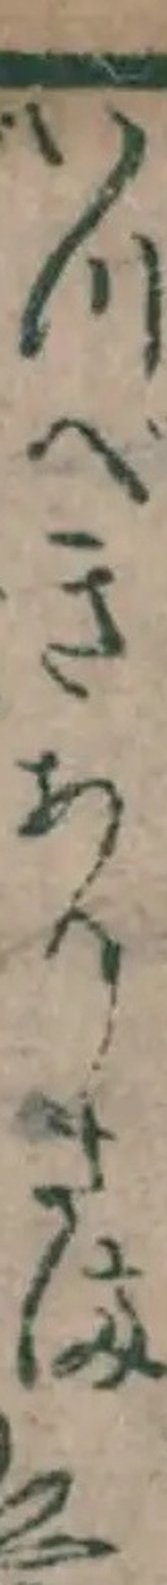いつべきありさま
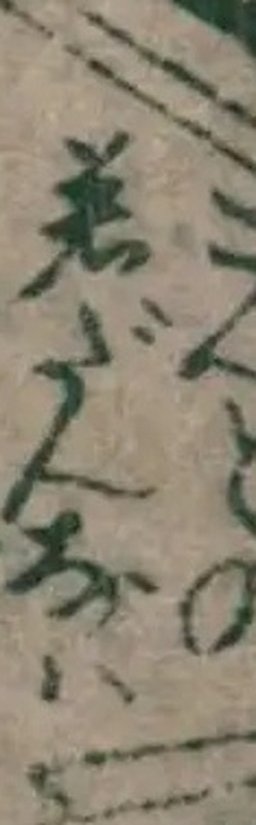若だんなは
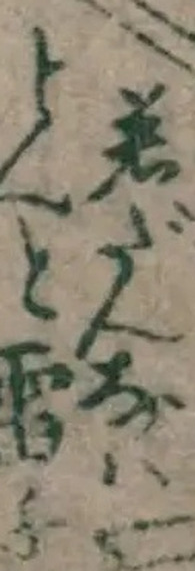若だんなは
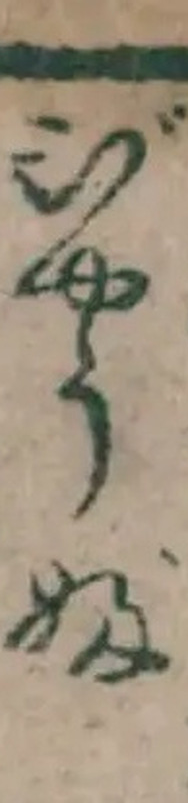びやうふ
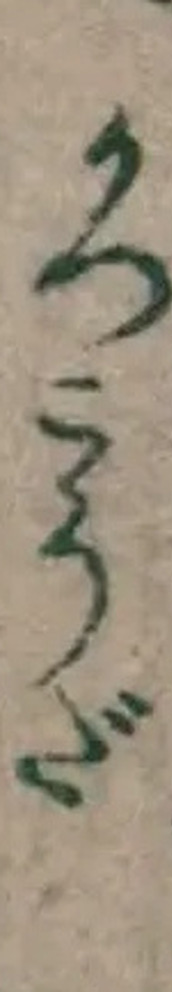かつこうだ
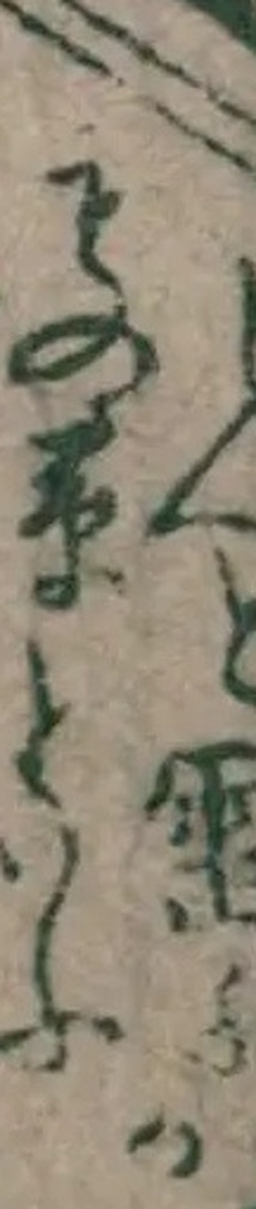もの草といふ
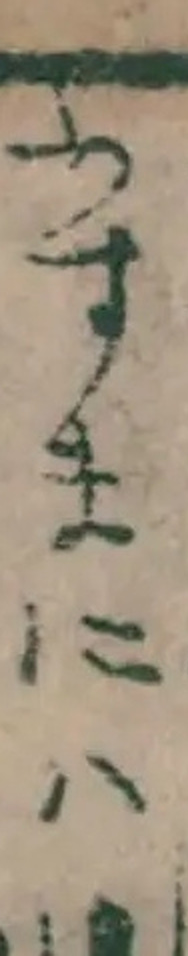ふすまには
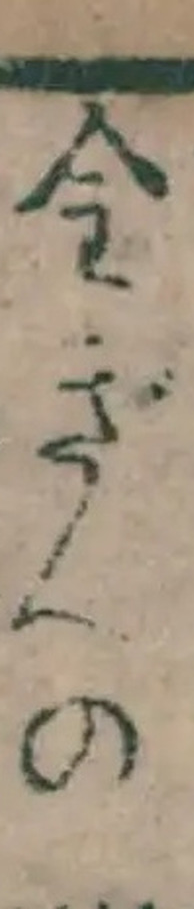金ぎんの
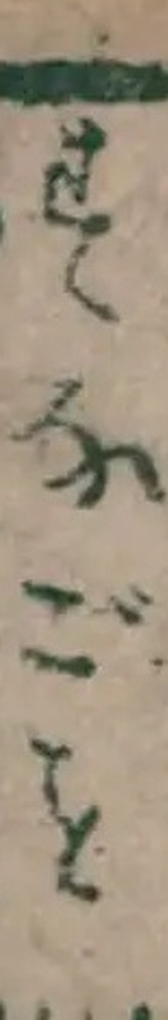すなごを
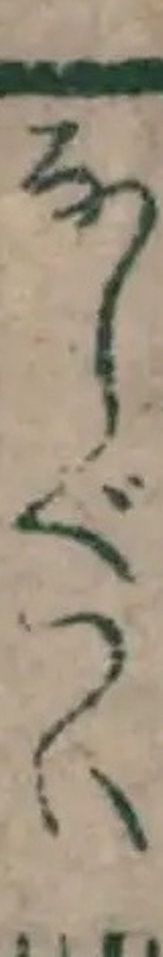ならべつい
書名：金々先生栄花夢 : 2巻
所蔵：国立国会図書館 National Diet Library, JAPAN
